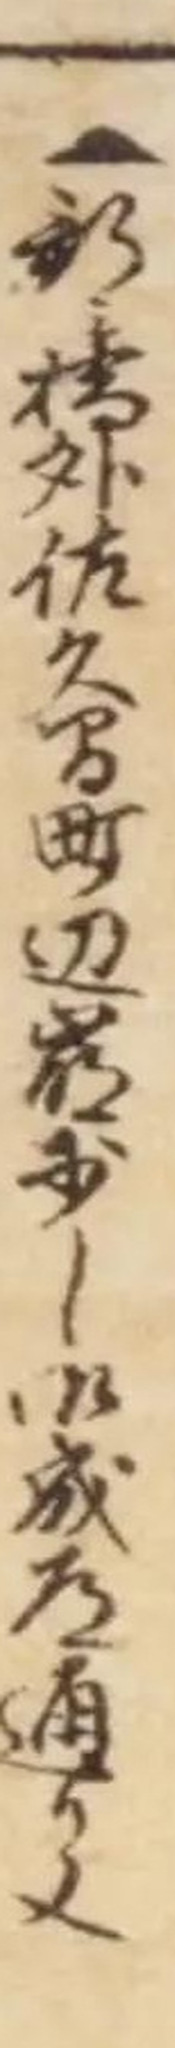▲新シ橋外佐久間町辺崩少し御成道通り又
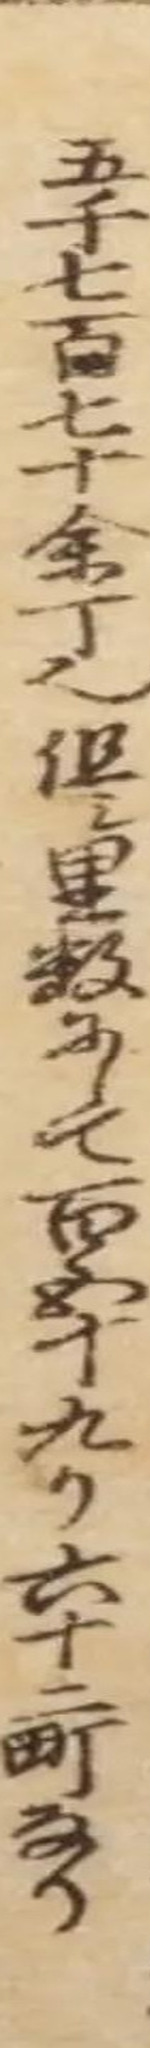五千七百七十余丁也但し里数にして百五十九り六十二町なり
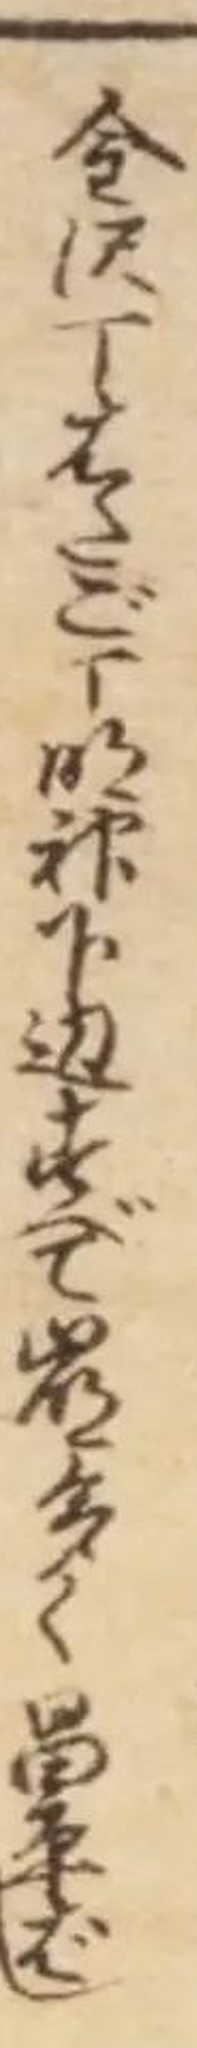金沢丁はたご丁明神下辺すべて崩多く昌平ばし
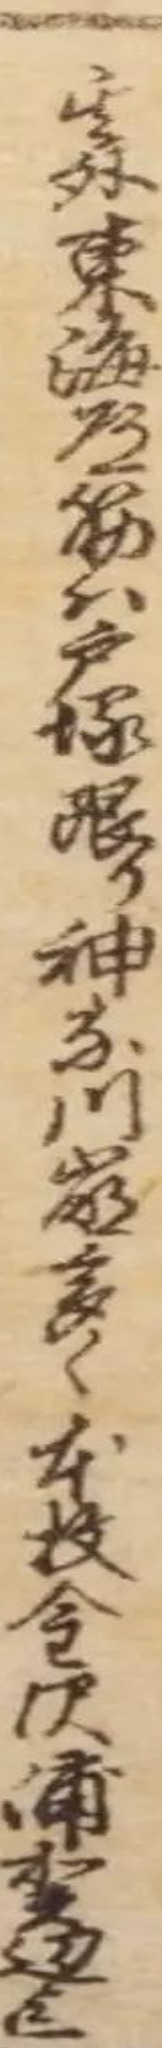其外東海道筋は戸塚限り神奈川崩多く本枚金沢浦賀辺迄
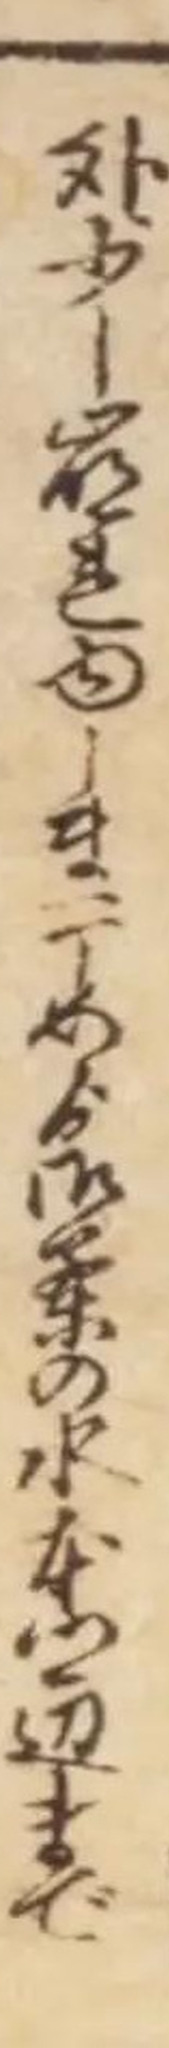外少し崩れゆしま一丁めよりお茶の水本郷辺まで
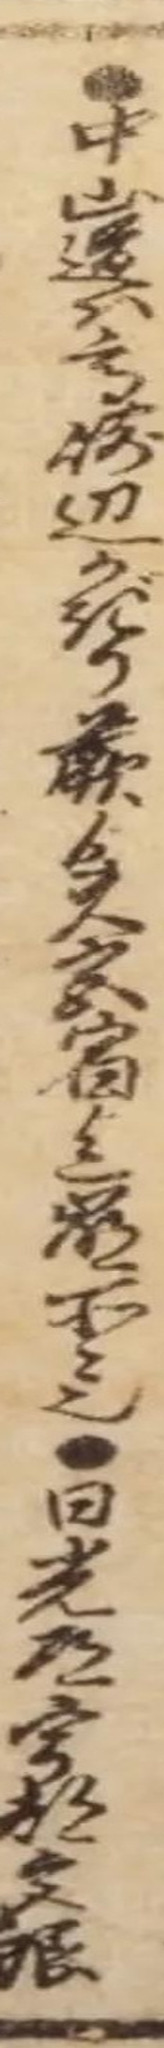●中山道は高崎辺かぎり蕨より大宮宿迄崩所〻也●日光道宇都宮限
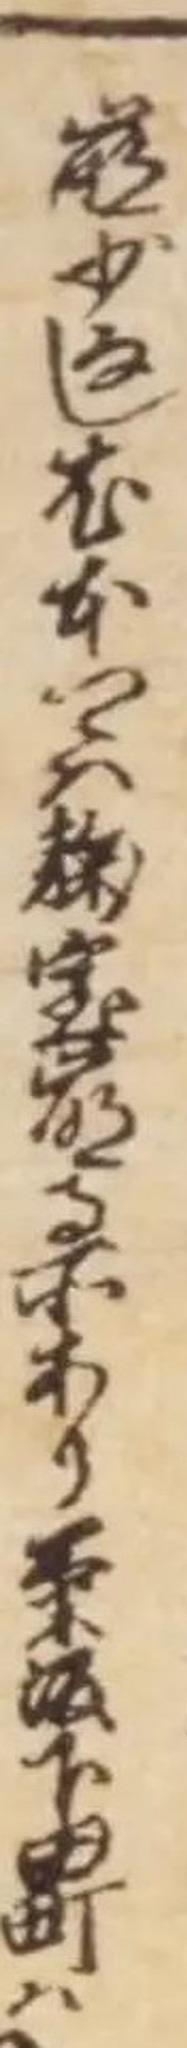崩少なし尤本郷は麹室崩る所あり菊坂下田町は
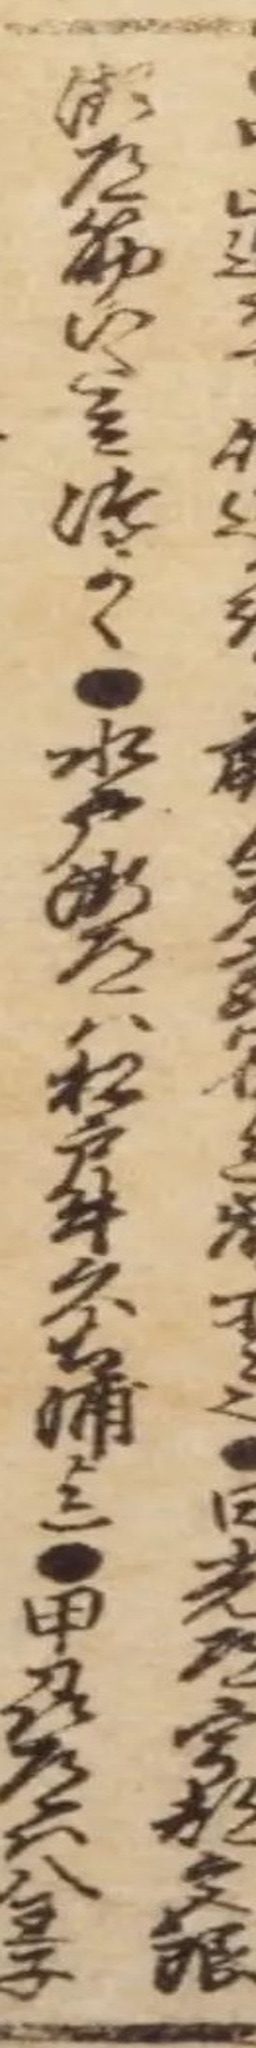街道筋いたみつよく●水戸街道は松戸牛久土浦迄●甲州道は八王子
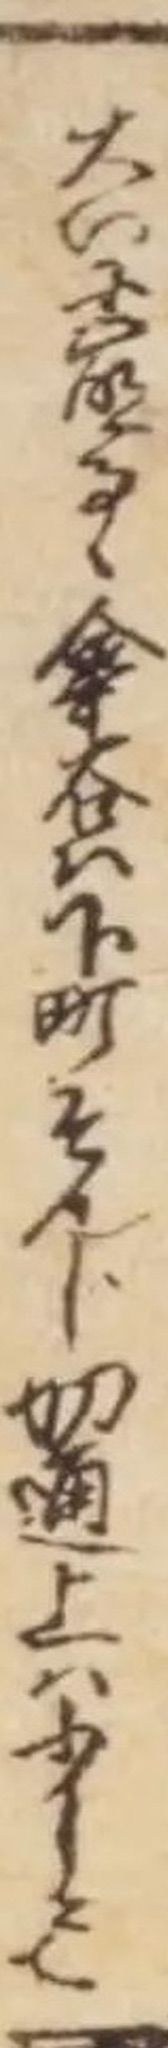大いに崩るゝ傘谷は下町そんじ切通上は少しにて
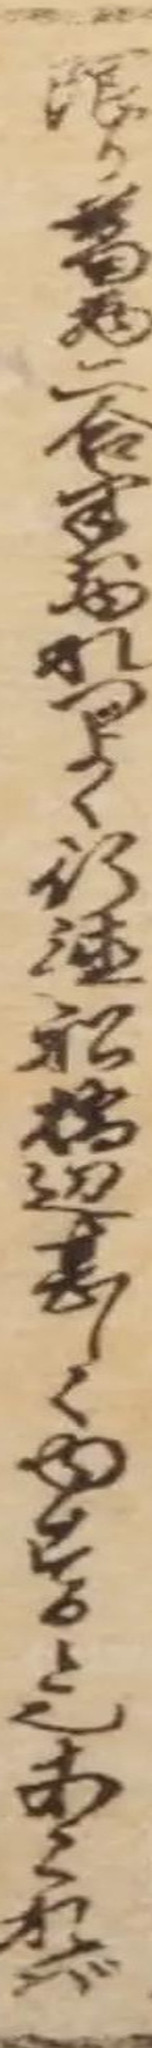限り葛西二合半はゆれつよく行徳船橋辺甚しくゆすると也あくれば
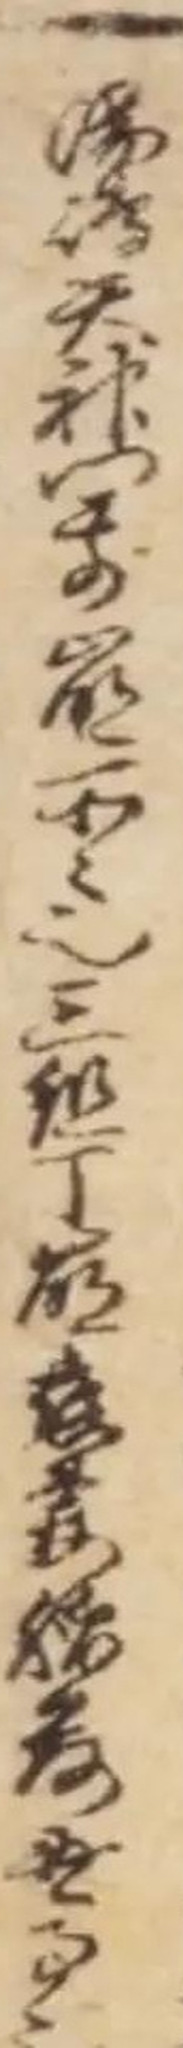湯島天神門前崩所〻也三組丁崩恋妻稲荷無事也
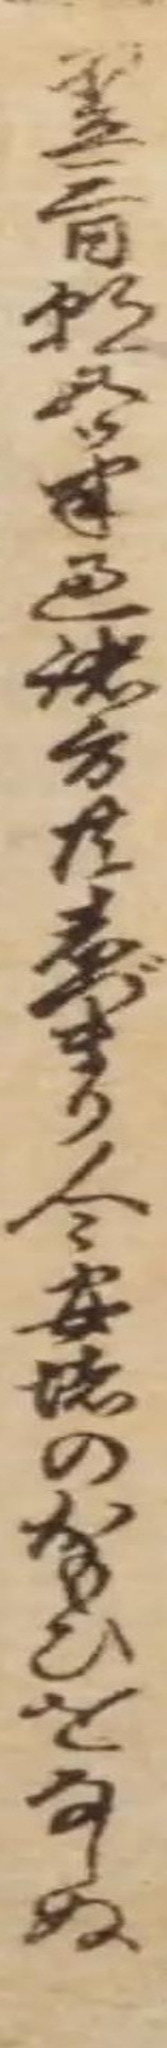翌三日朝五ツ半過諸方共しづまり人〻安堵のおもひをなしぬ
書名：御江戸関八州大地震出火巨細記
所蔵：国立国会図書館 National Diet Library, JAPAN
